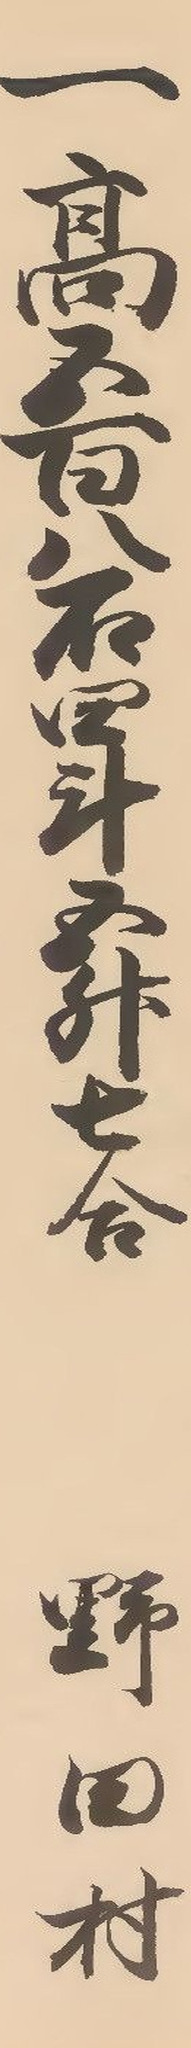一高五百八石四斗五升七合野田村
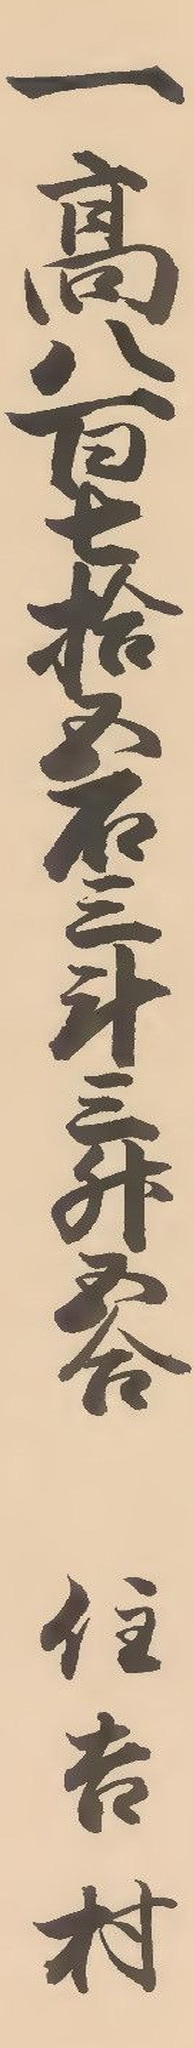一高八百七拾五石三斗三升五合住吉村
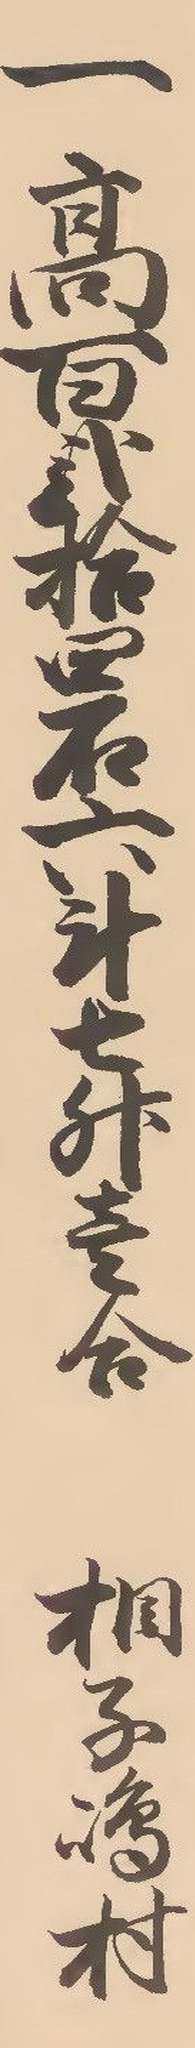一高百弐拾四石六斗七升壱合相子島村
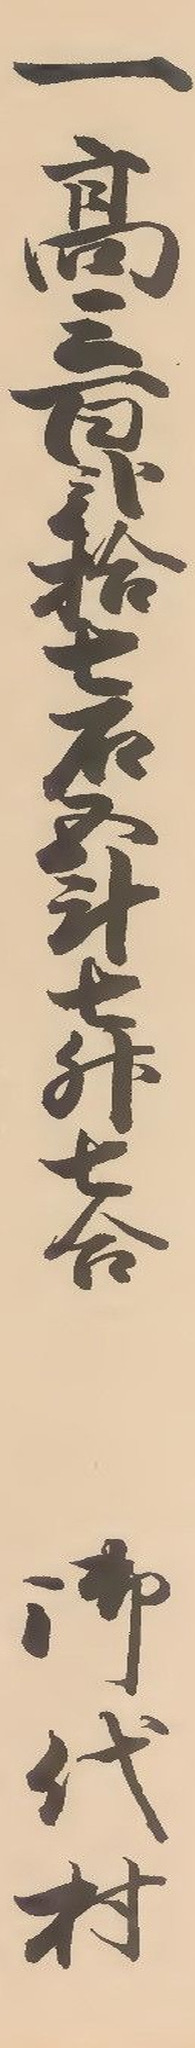一高三百弐拾七石五斗七升七合御代村
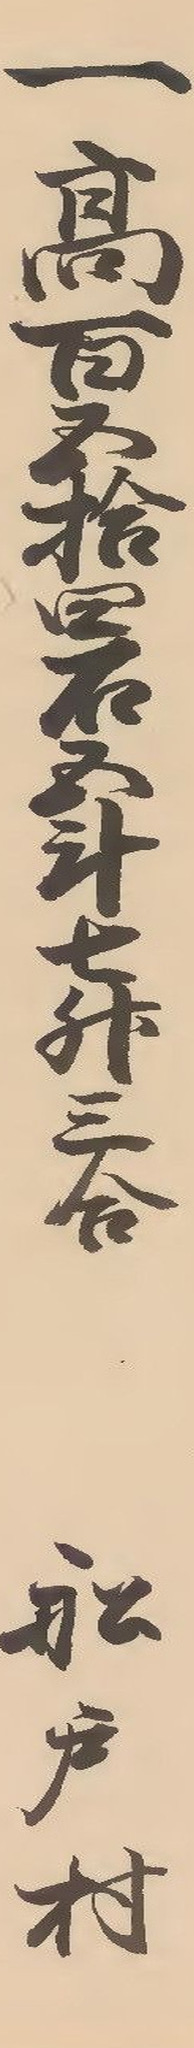一高百五拾四石五斗七升三合船戸村
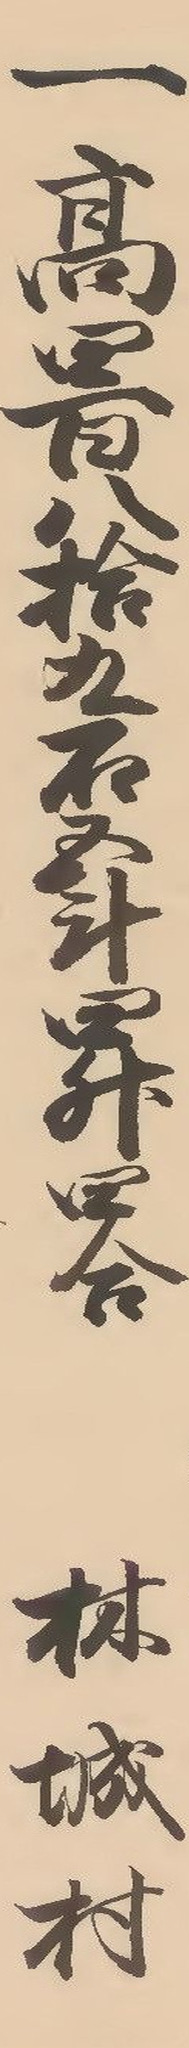一高四百八拾九石五斗四升四合林城村
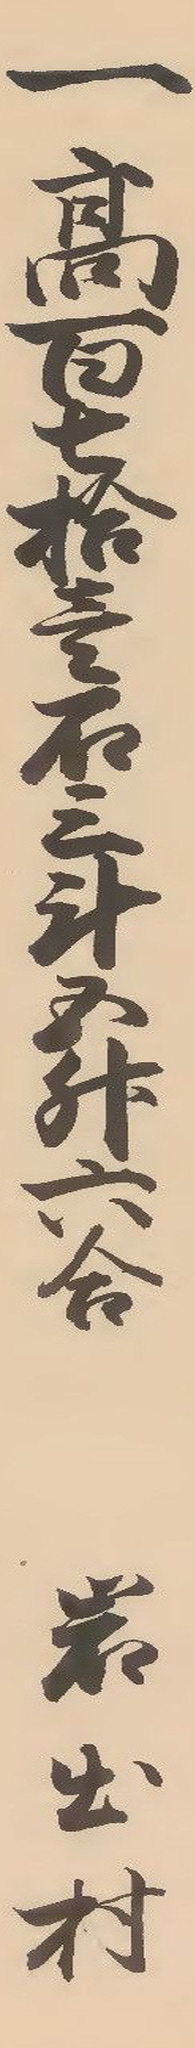一高百七拾壱石三斗五升六合岩出村

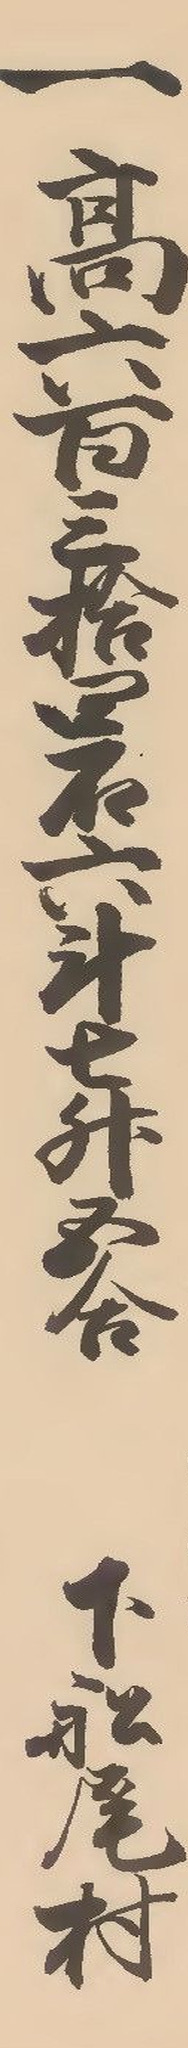一高六百三拾四石六斗七升五合下船尾村
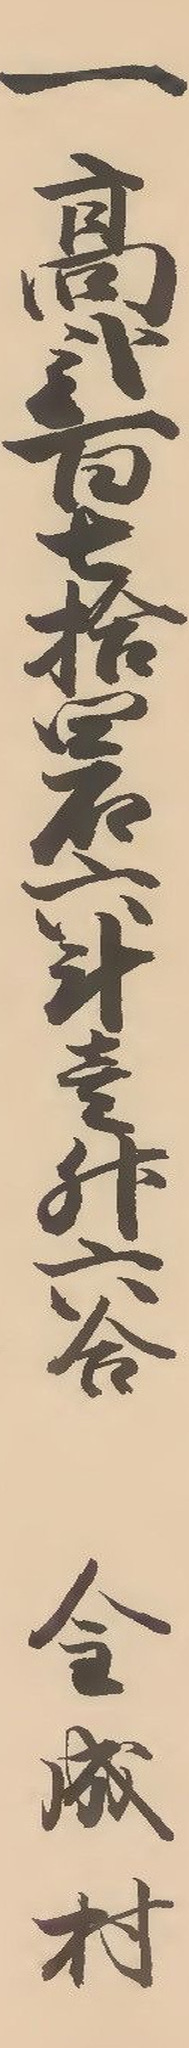一高弐百七拾四石六斗壱升六合金成村
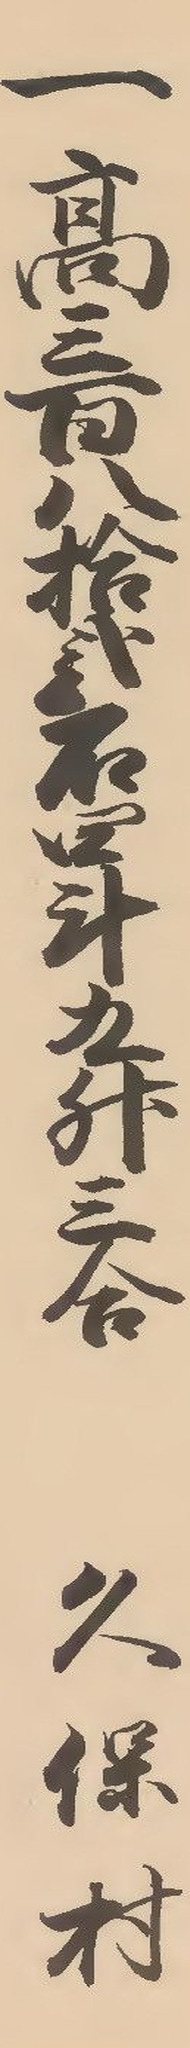一高三百八拾弐名四斗九升三合久保村
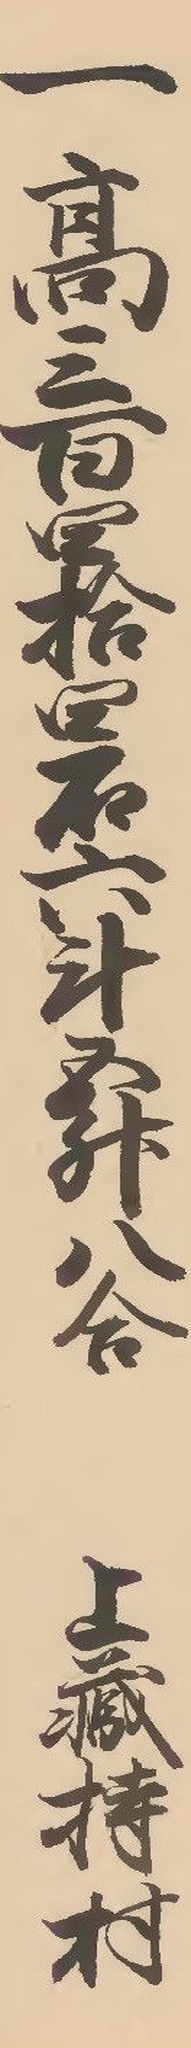一高三百四拾四石六斗五升八合上蔵持村
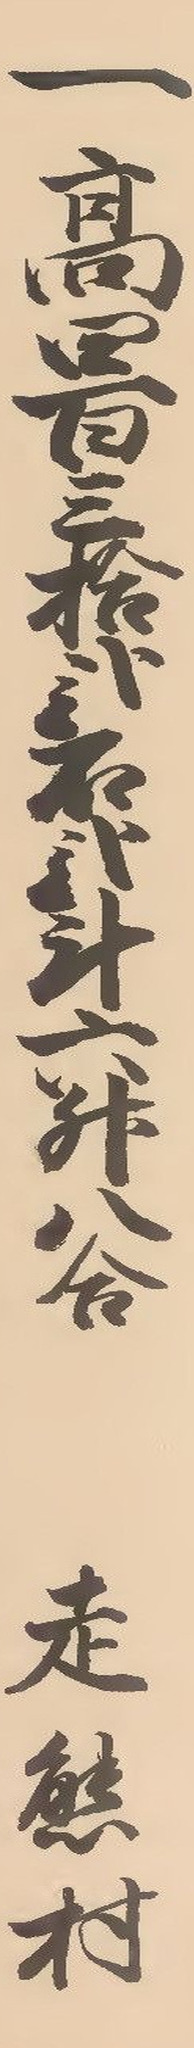一高四百三拾弐石弐斗六升八合走熊村
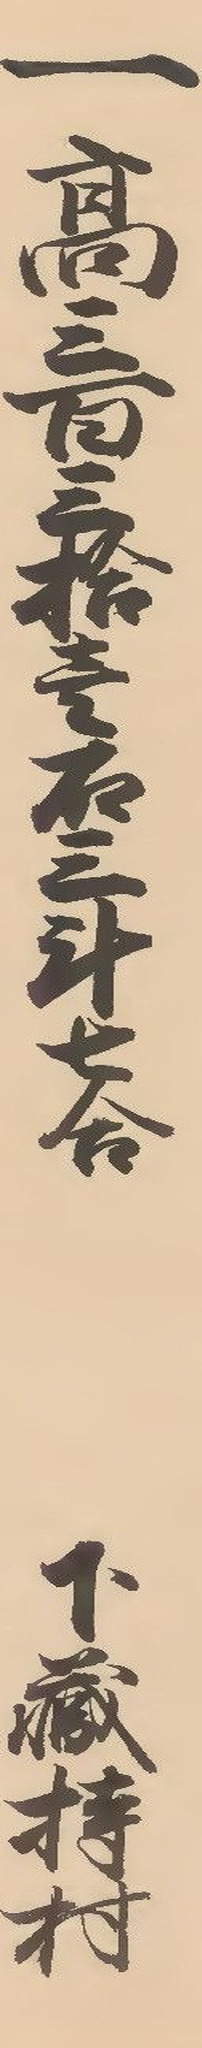一高三百三拾壱石三斗七合下蔵持村
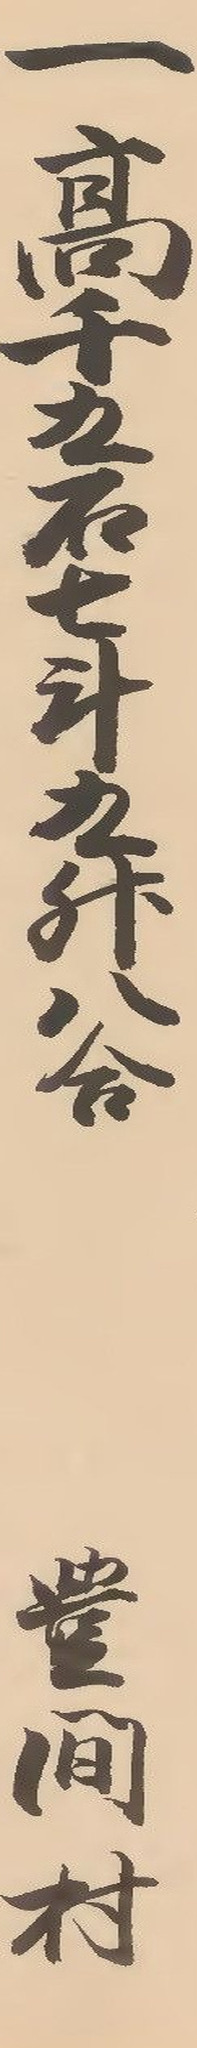一高千九石七斗九升八合豊間村
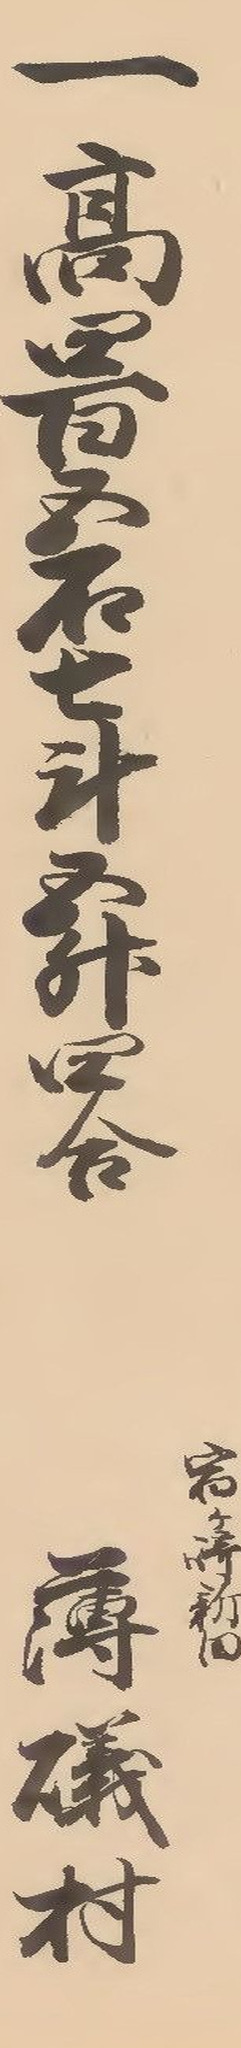一高四百五石七斗五升四合薄磯村

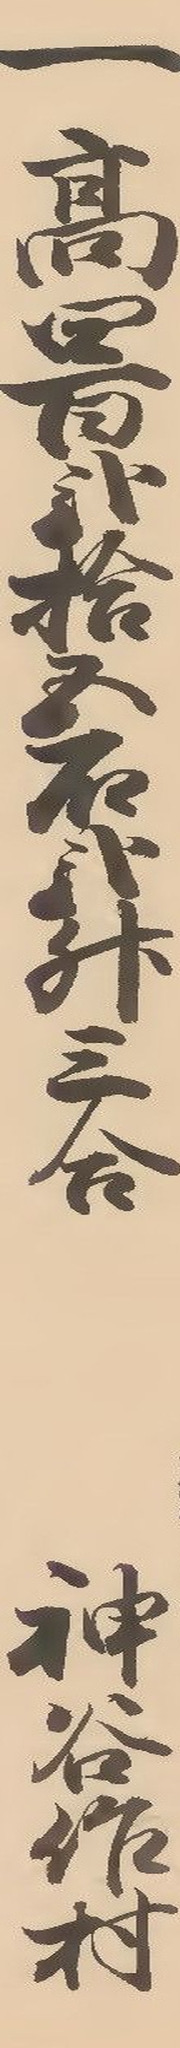一高四百弐拾五石弐升三合神谷作村
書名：陸奥国郷帳　３
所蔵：国立公文書館 National Archives of Japan
